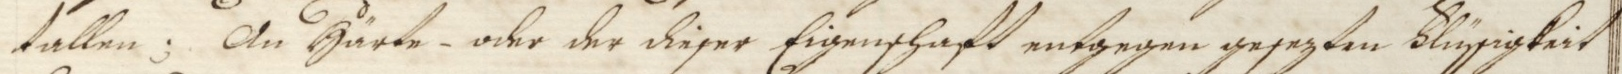tallen. An Härte — oder der dieser Eigenschaft entgegen gesezten Flüssigkeit
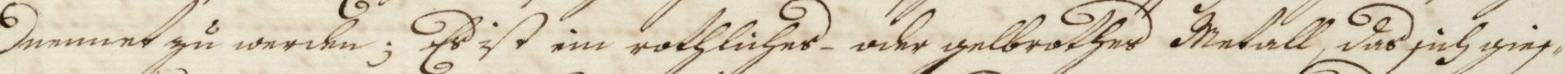nennet zu werden. Es ist ein rothliches — oder gelbrothes Metall, das sich gies-
